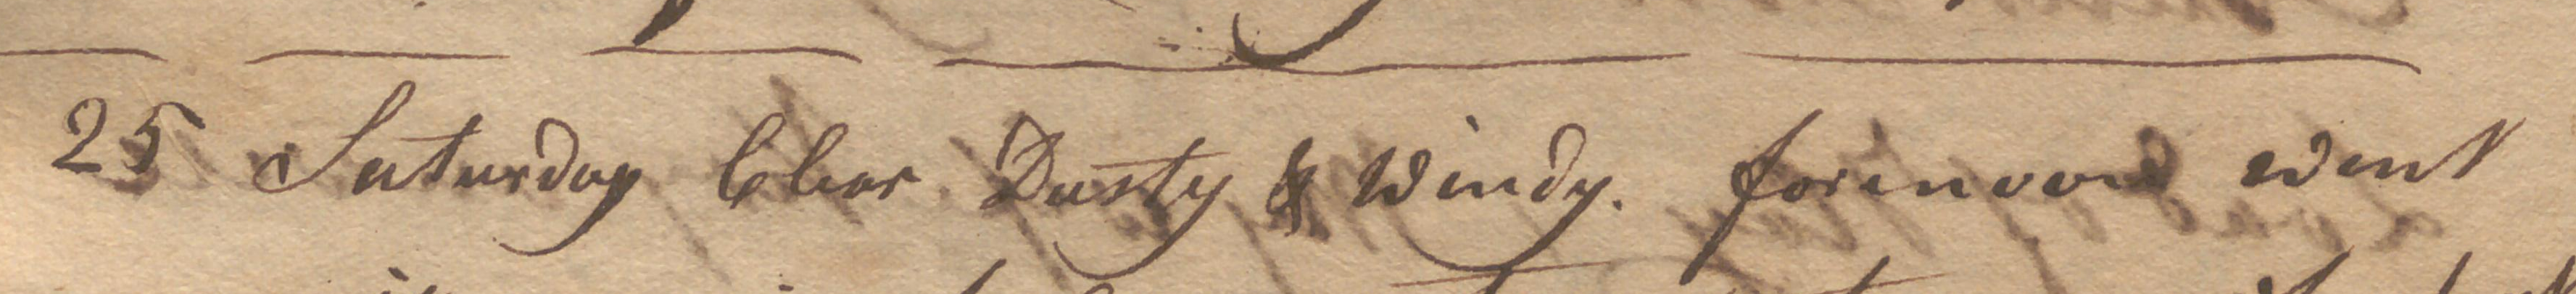25 Saturday Clear Dusty & Windy. forenoon went
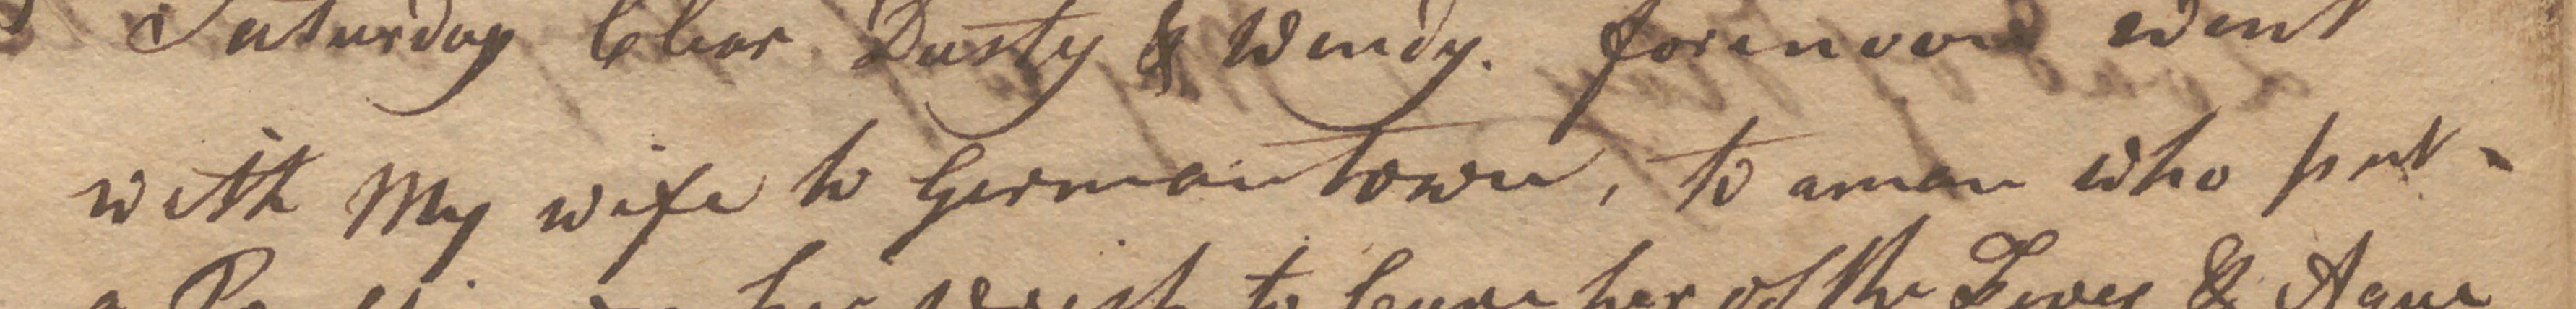with my wife to Germantown, to a man who put
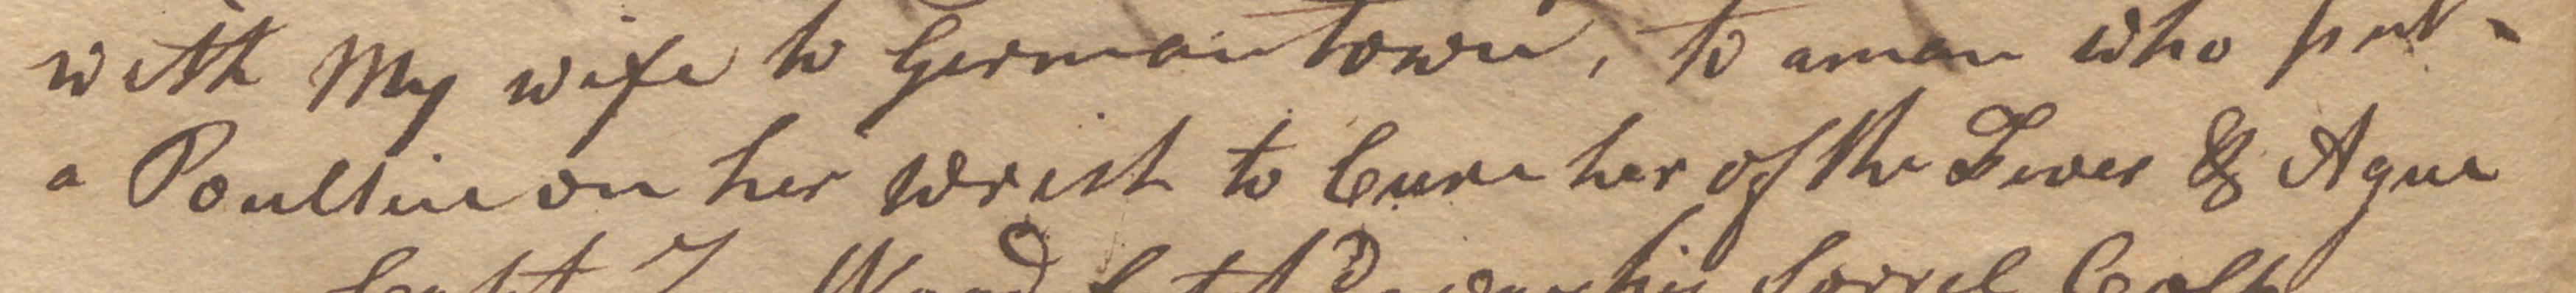a Poultice on her wrist to Cure her of the Fever & Ague
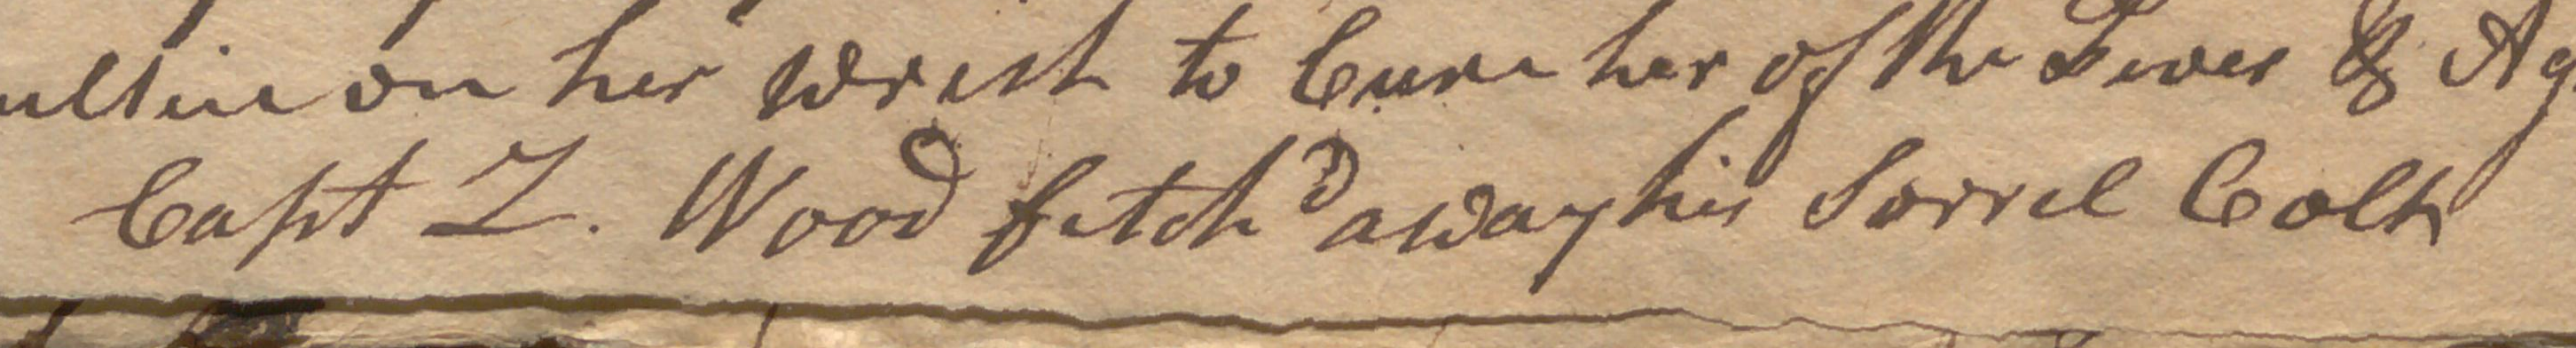Capt Z. Wood fetch^d. away his Sorrel Colt
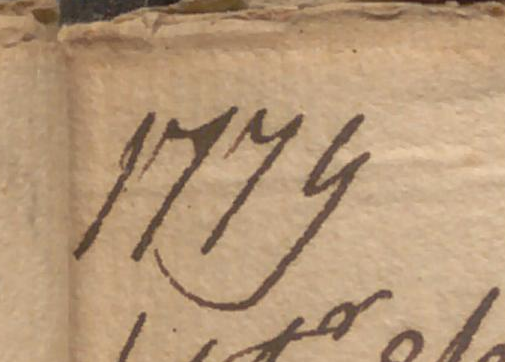1779
